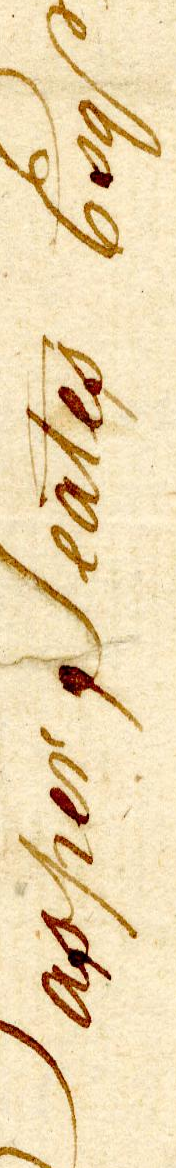Jasper Yeates Esq^r
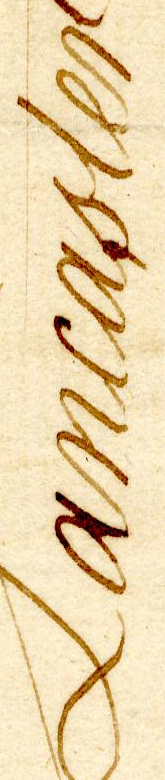Lancaster
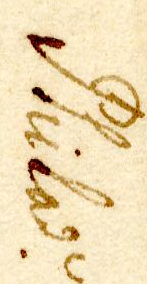Philad^a.
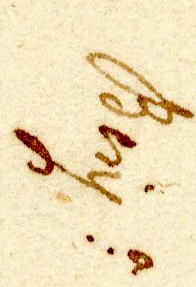Benj^a:
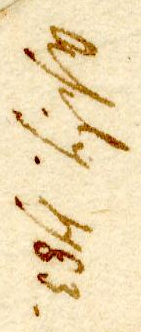Ap^l. 7. 1783.
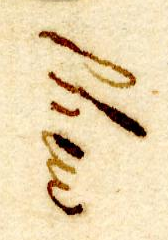Chew
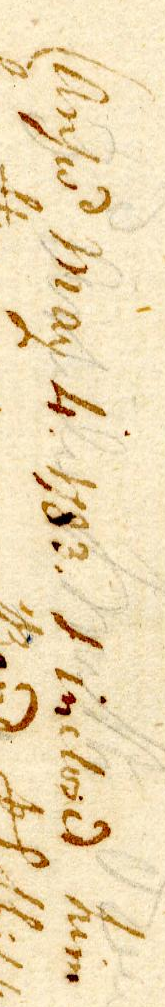(Answ^d May 4. 1783. I inclosed him
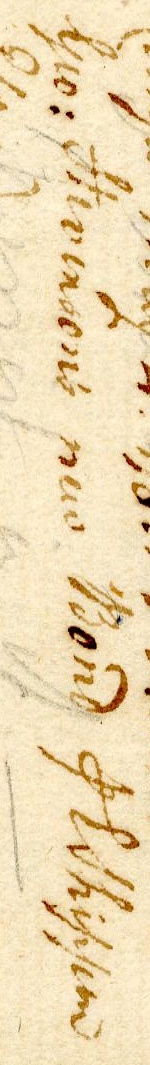Geo: Stevenson's new Bond of EShippen
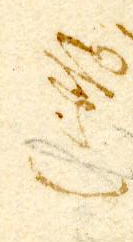Esq.)
